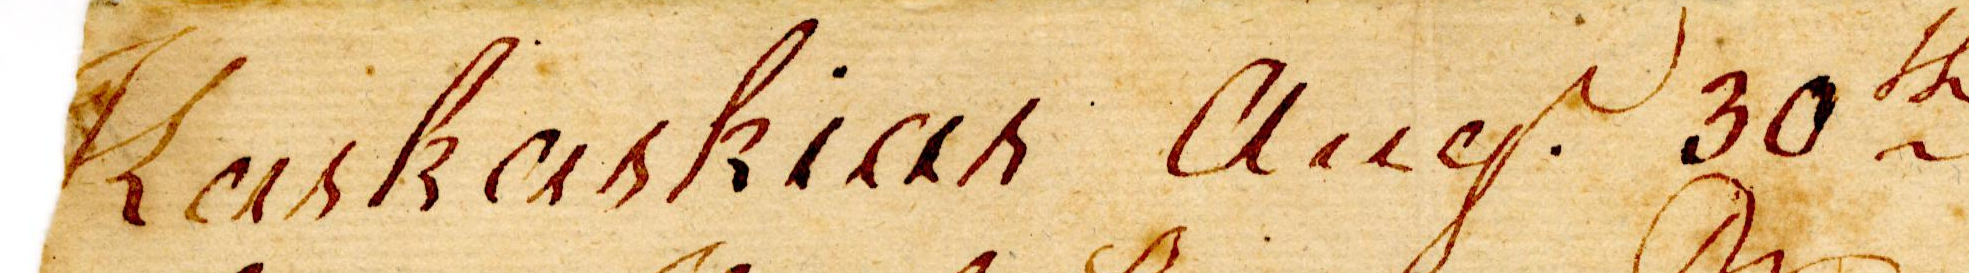Kaskaskias Aug^t. 30^th.
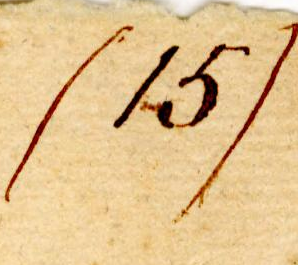(15)
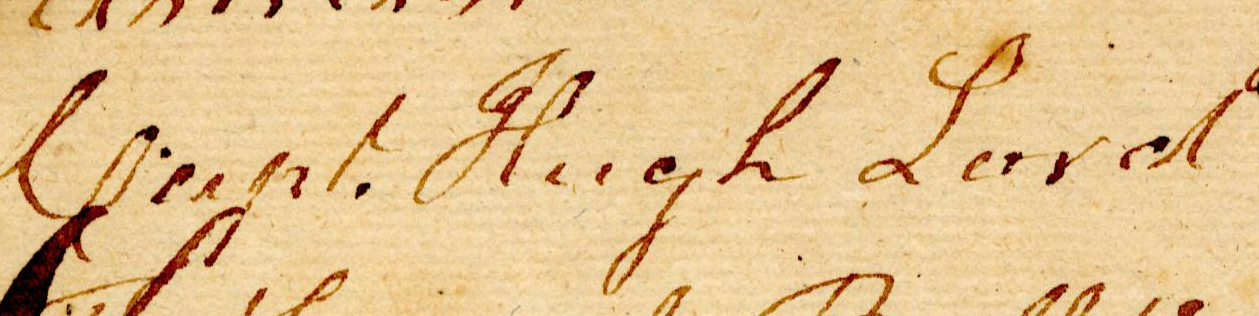Cap^t Hugh Lord
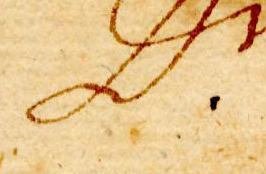D^r
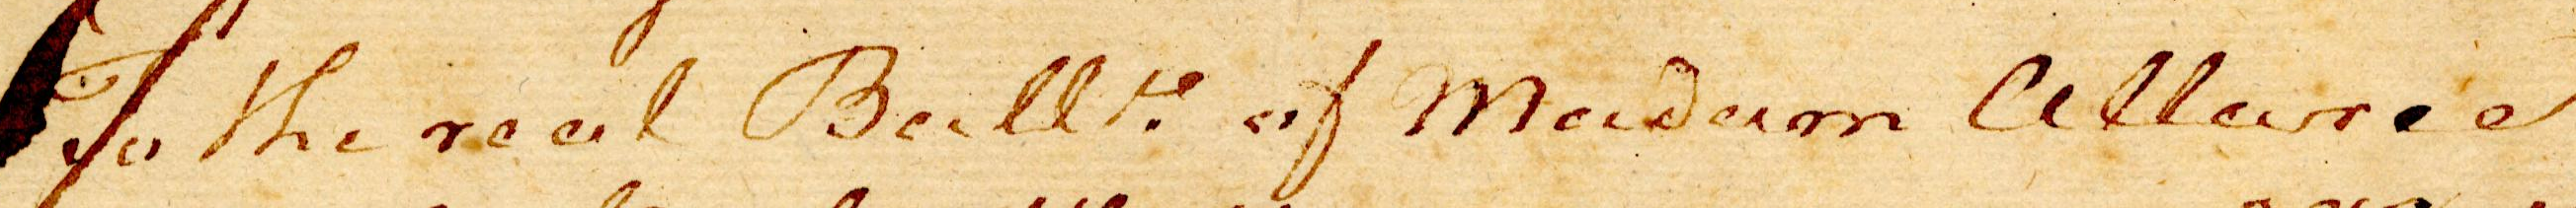To the real Ball^ce. of madam Allaree
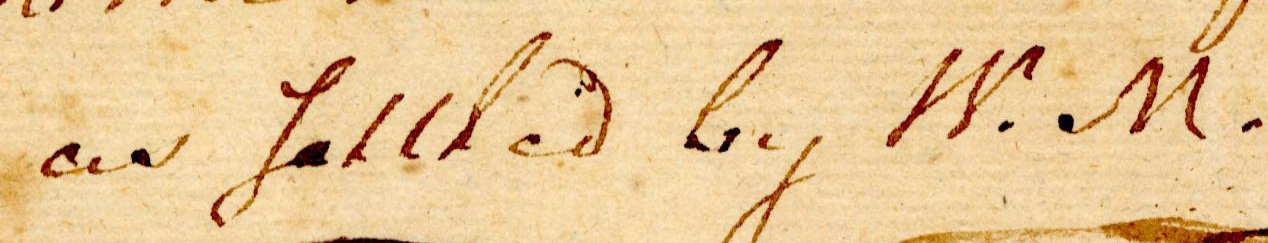as settled by W. M.
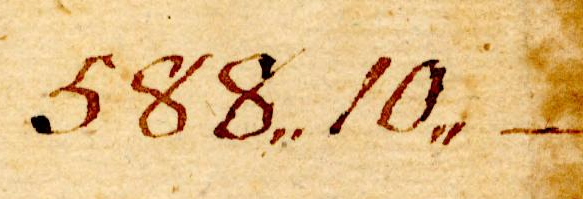588.10.-
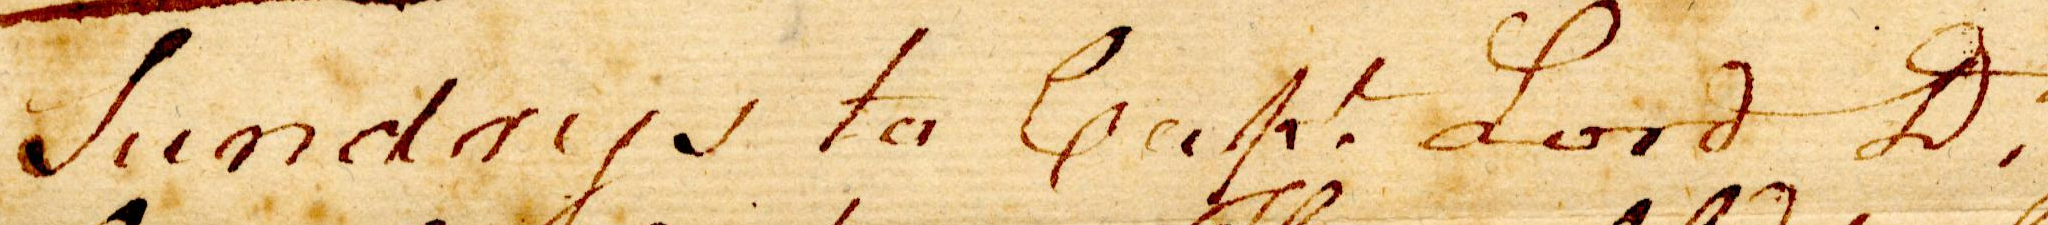Sundrys to Cap^t. Lord D^r
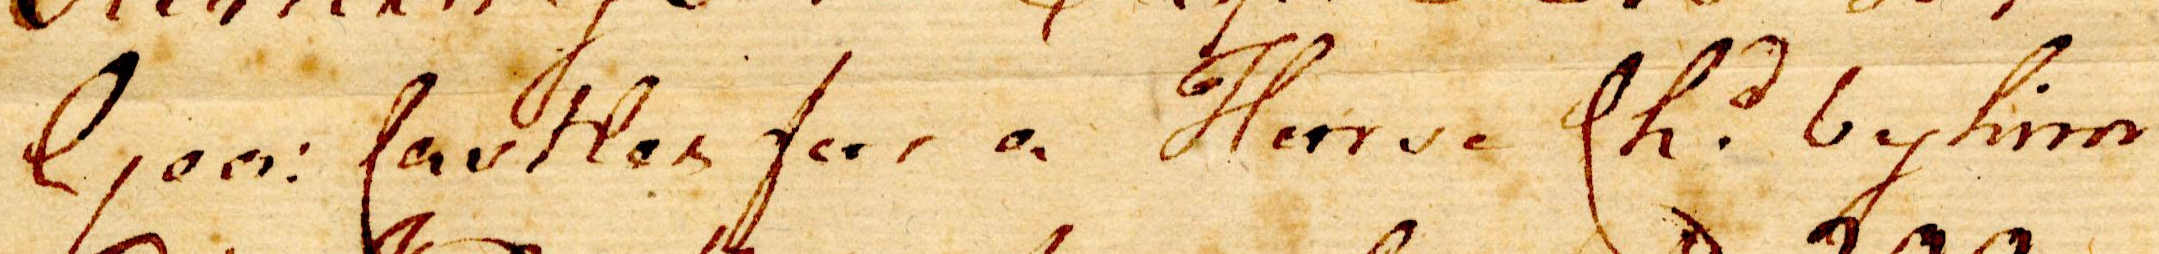Gov Castles for a Horse Ch^d. by him
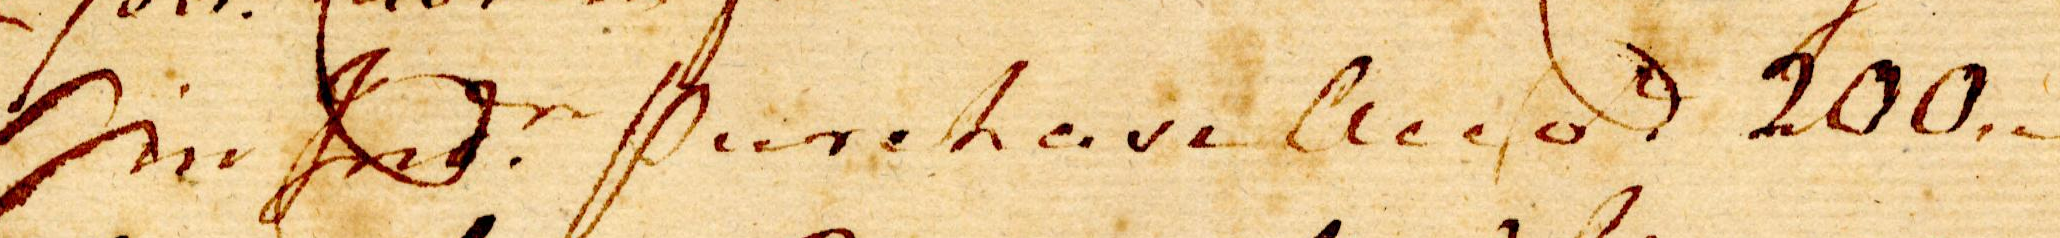in Ind^n purchases Acco^t 200.
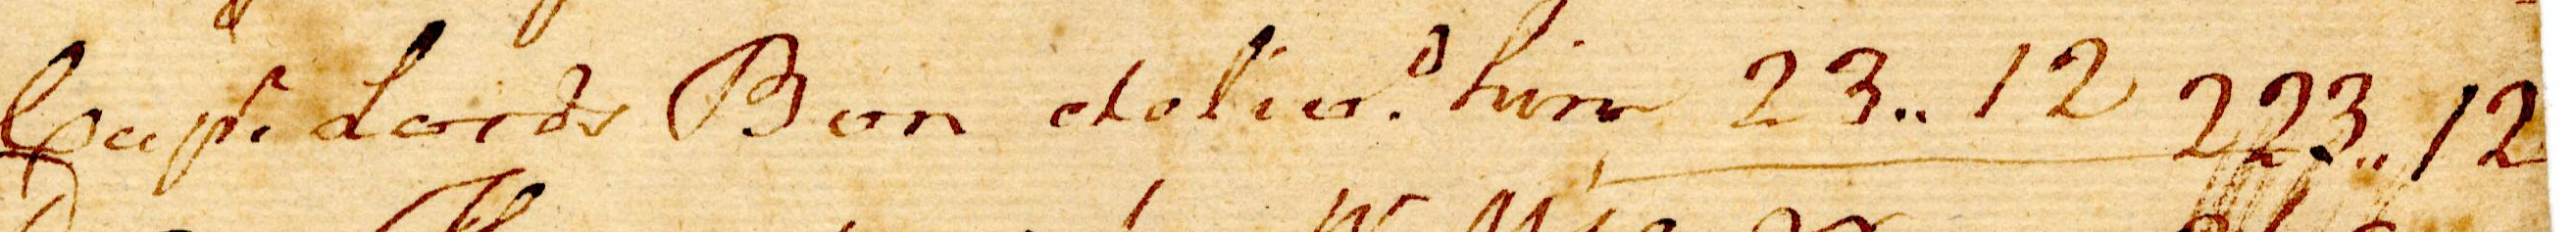Cap^t Lords Bon deliev^d him 23.12 223.12
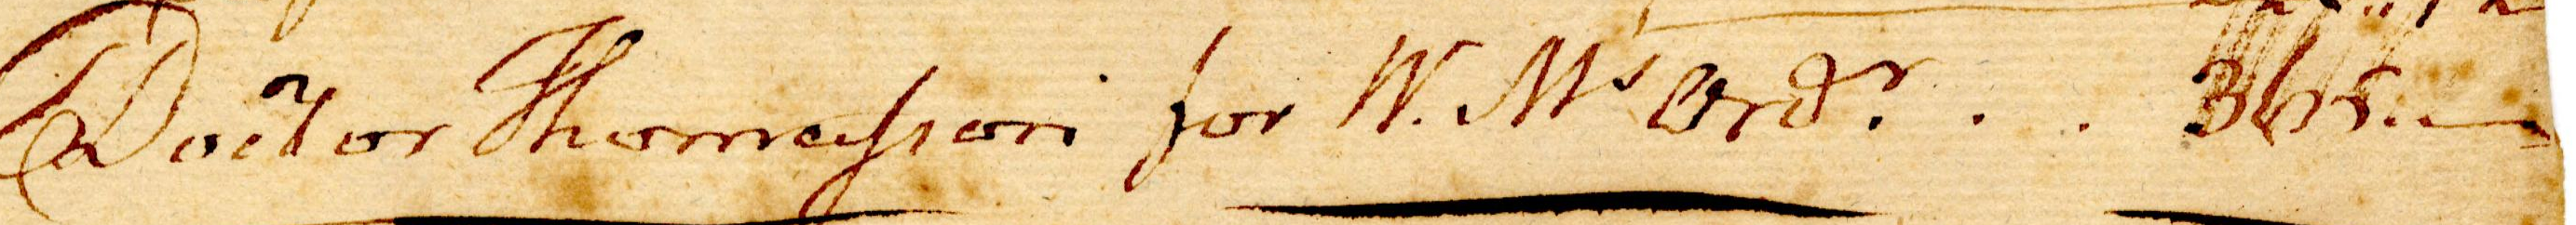Dailor Thomasson for W. M. Ord^r... 365.-
